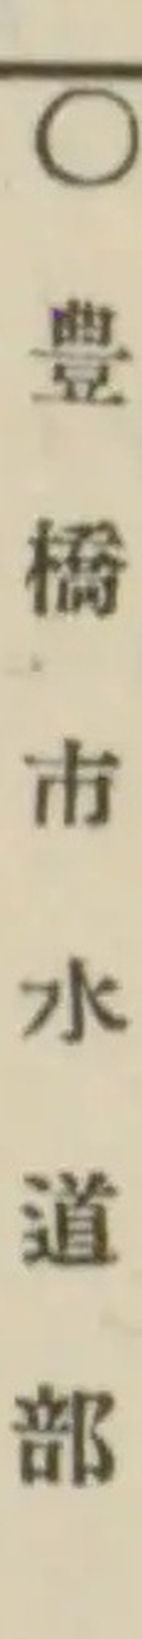○豊橋市水道部
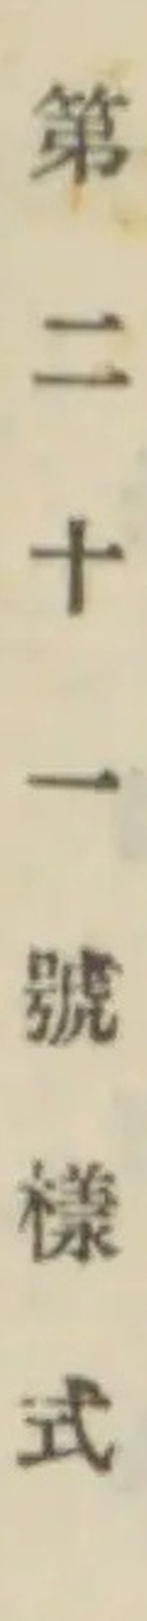第二十一号様式
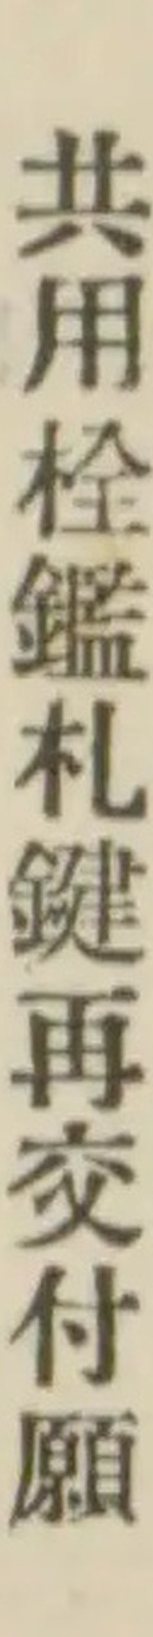共用栓鑑札鍵再交付願
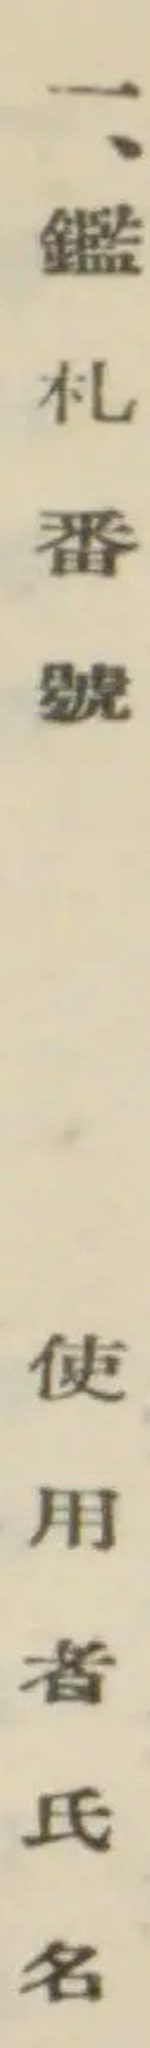一、鑑札番号使用者氏名
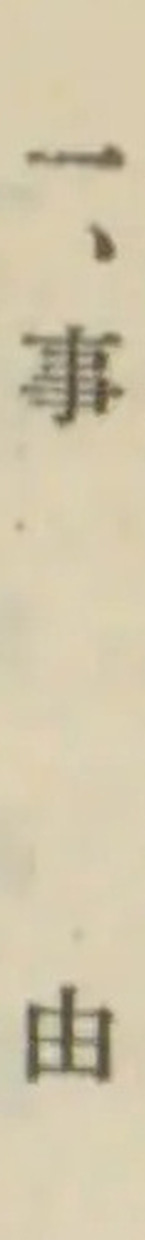一、事由
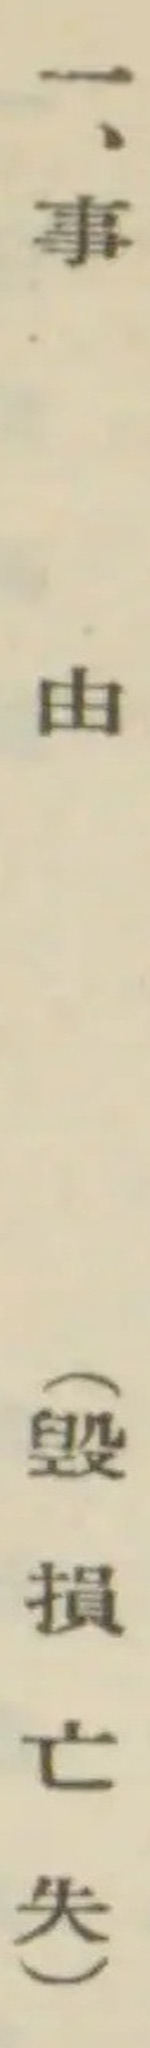一、事由(毀損亡失)
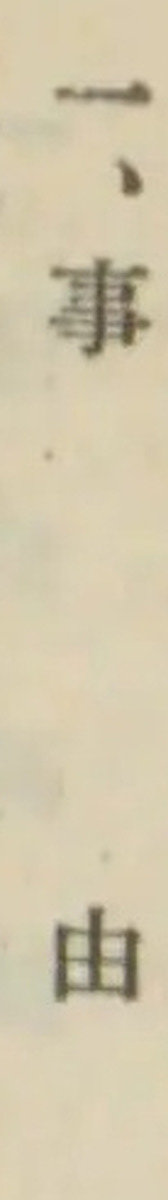一、事由
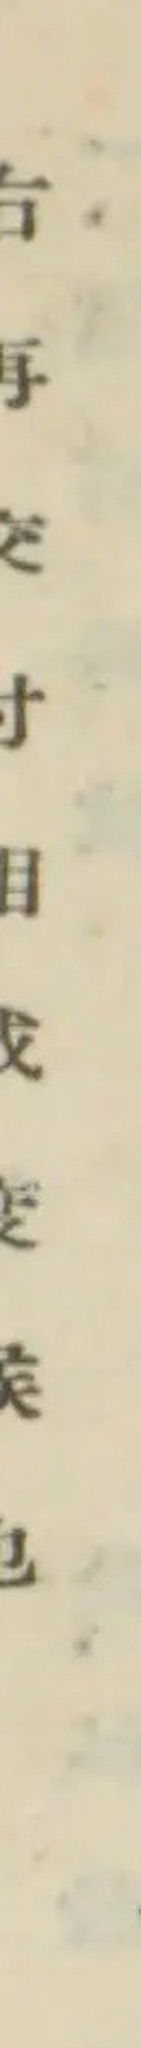右再交付相成度候也
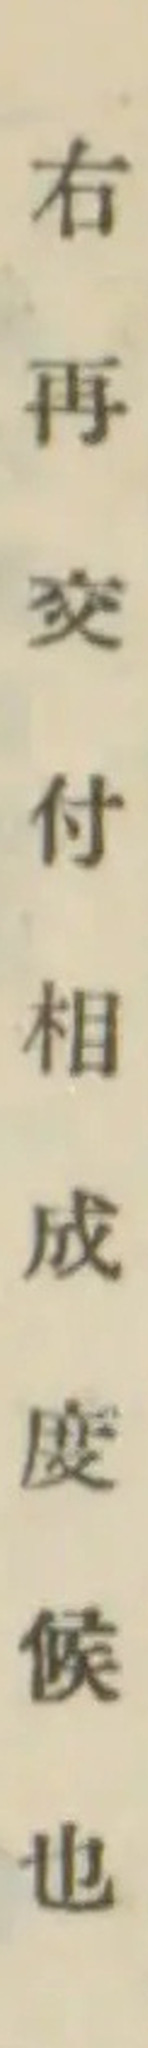右再交付相成度候也
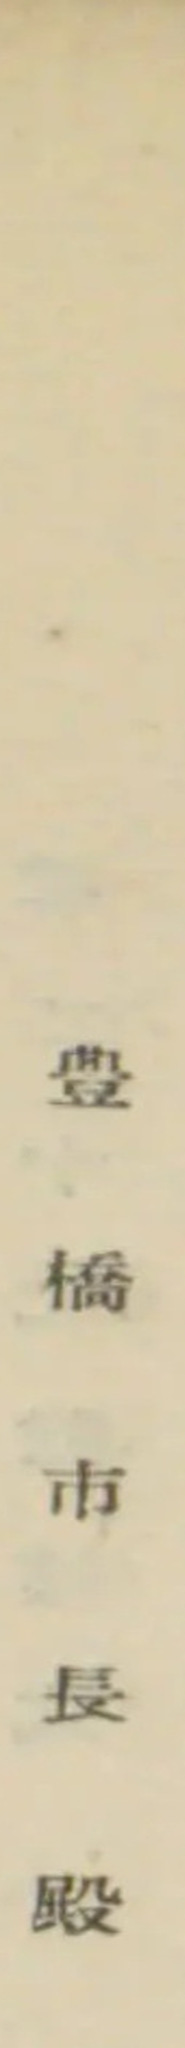豊橋市長殿

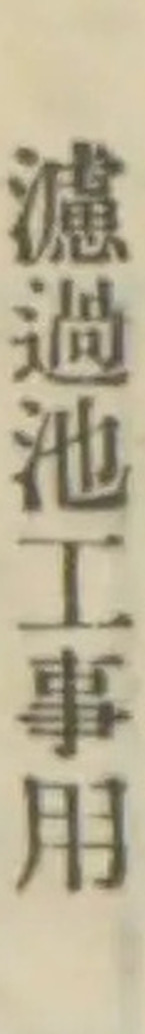濾過池工事用
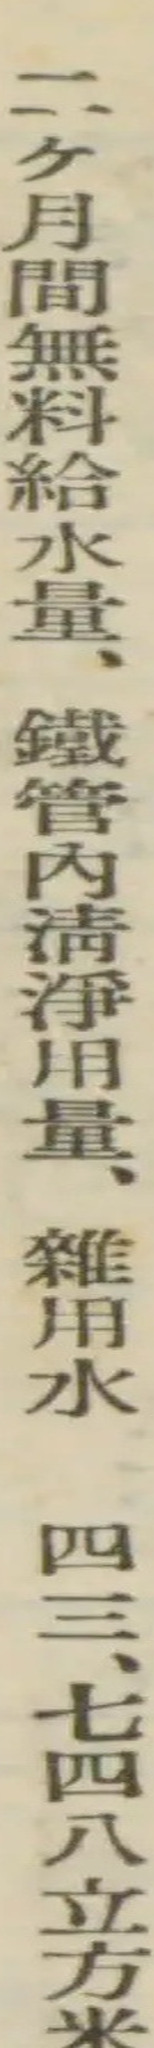二ヶ月間無料給水量、鉄管内清浄用量、雑用水四三、七四八立方米
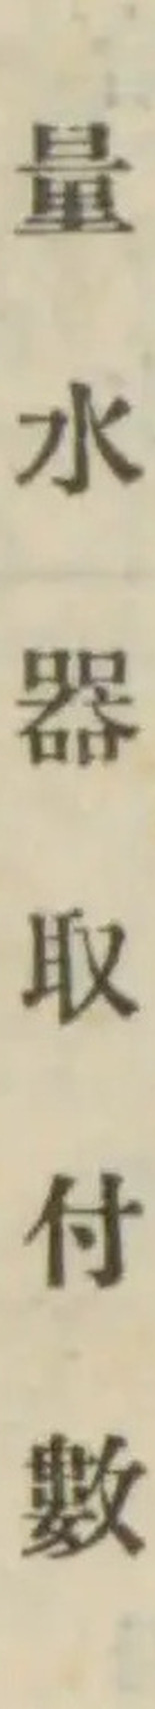量水器取付数
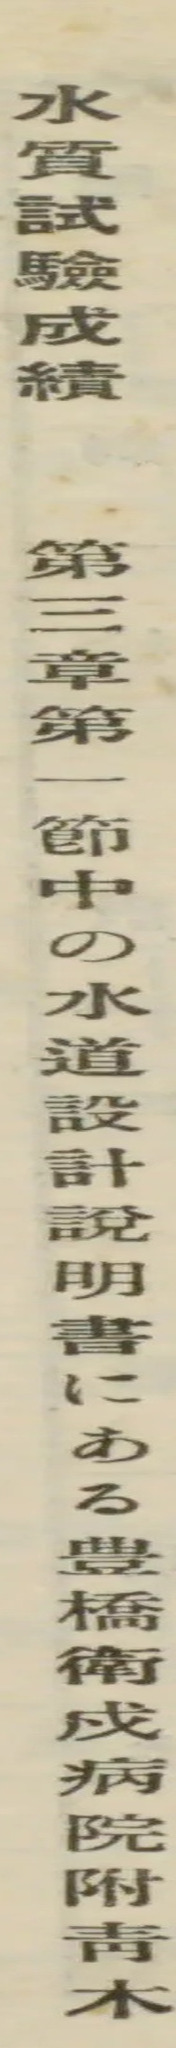水質試験成績第三章第一節中の水道設計説明書にある豊橋衛戌病院附青木
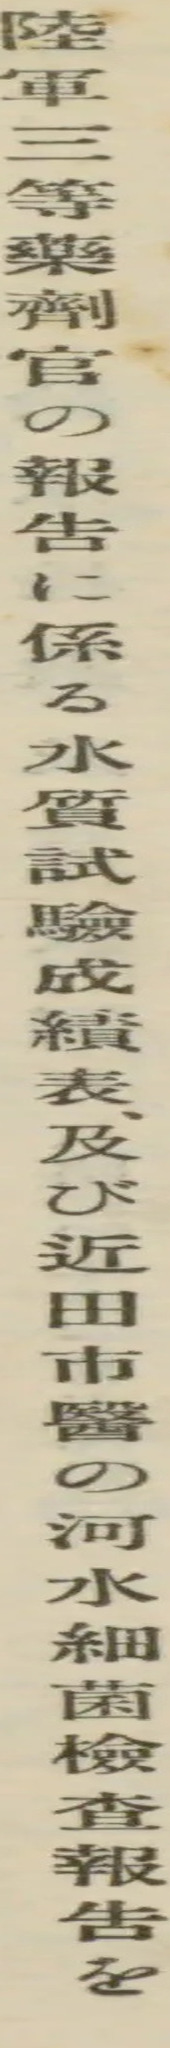陸軍三等薬剤官の報告に係る水質試験成績表、及び近田市医の河水細菌検査報告を
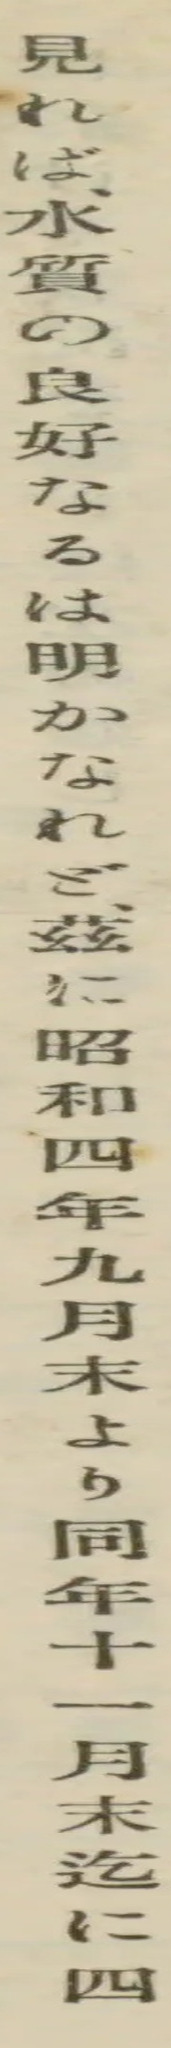見れば、水質の良好なるは明らかなれど、茲に昭和四年九月末より同年十一月末迄に四
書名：豊橋市水道誌
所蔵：国立国会図書館 National Diet Library, JAPAN
